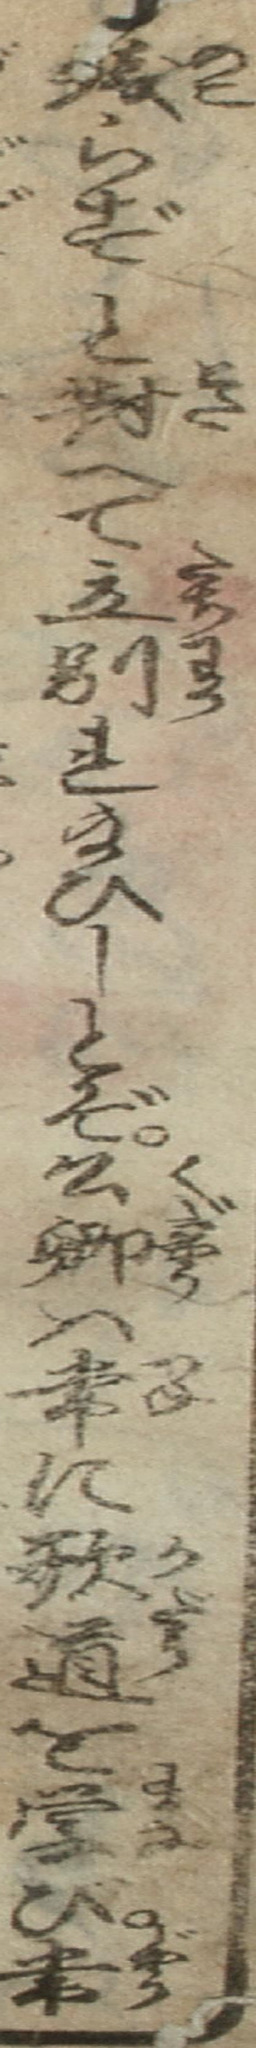残らずと対へて立別れ給ひしとぞ。公卿は常に歌道を学び常
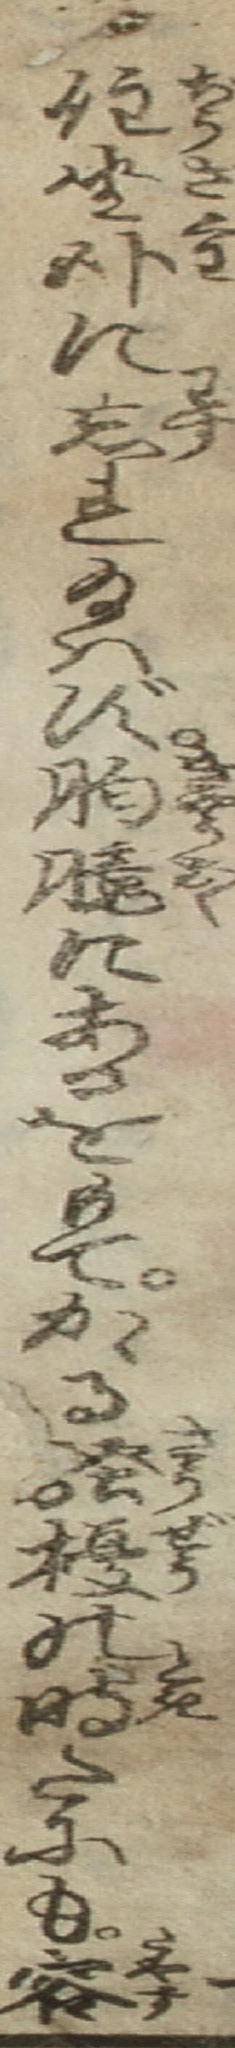住坐臥に忘れ給はず。胸臆にあるをもて。かゝる騒擾の時たにも。容
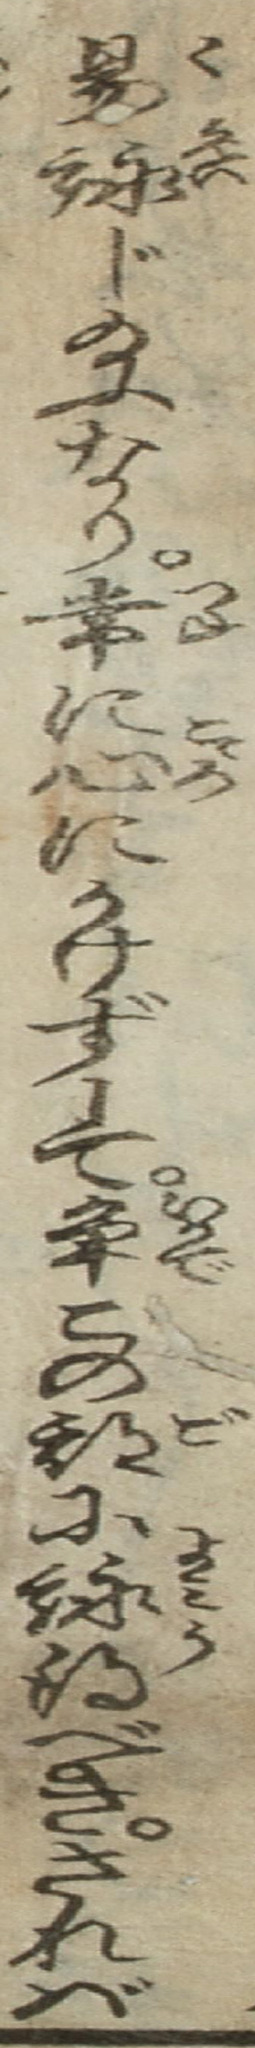易詠じ給ふなり。常に心にかけずして争この期に詠得べき。されば
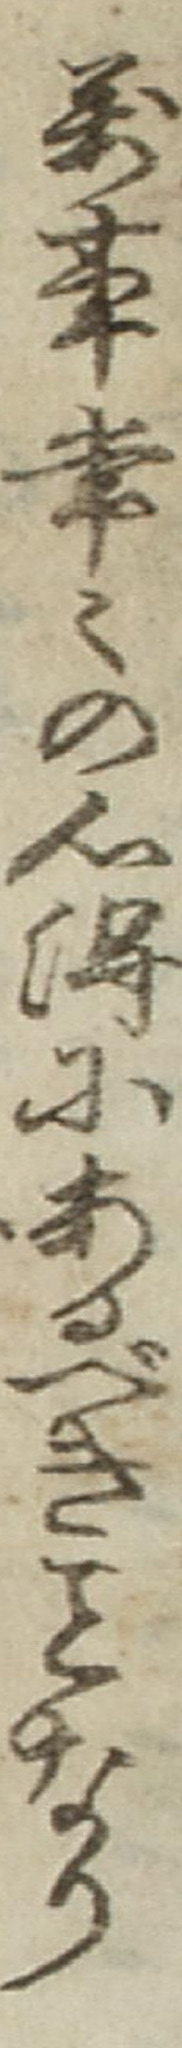万事常々の心得にあるべきことなり
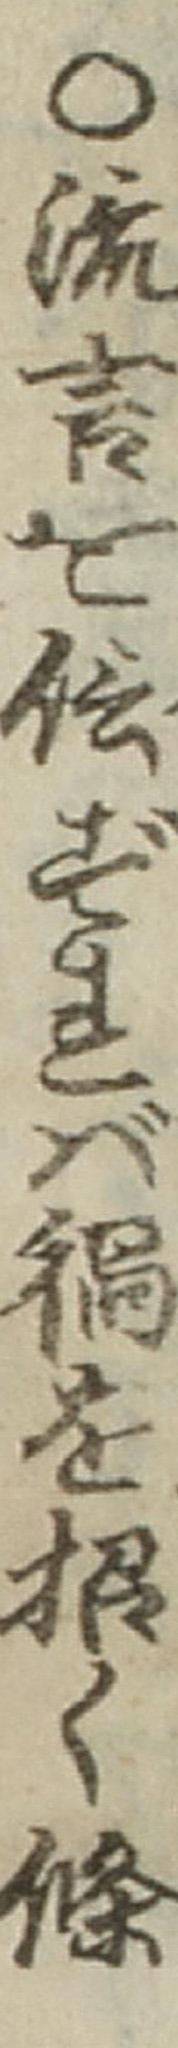◯流言を信ずれば禍を招く條
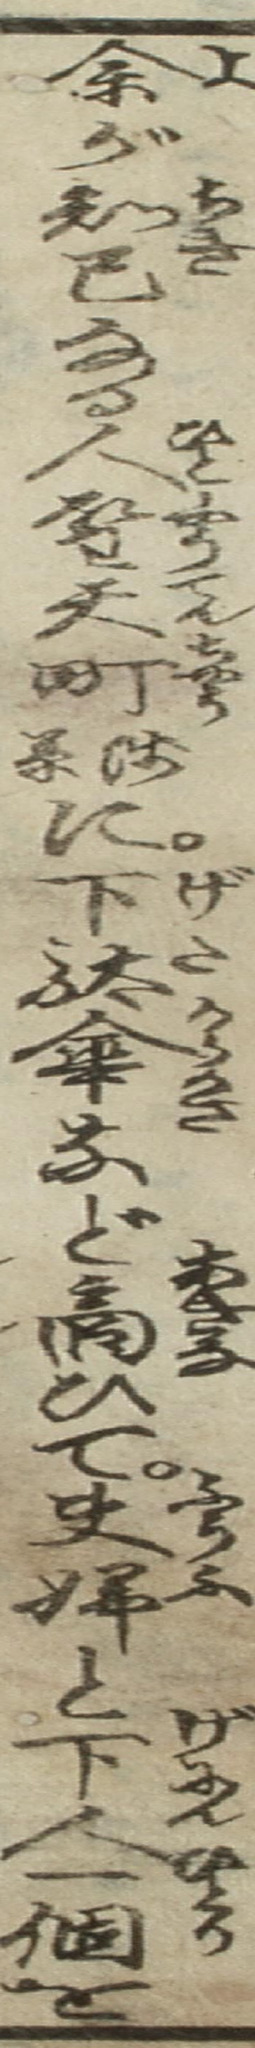余が知己なる人聖天町浅草に下駄傘など商ひて。夫婦と下男一個を
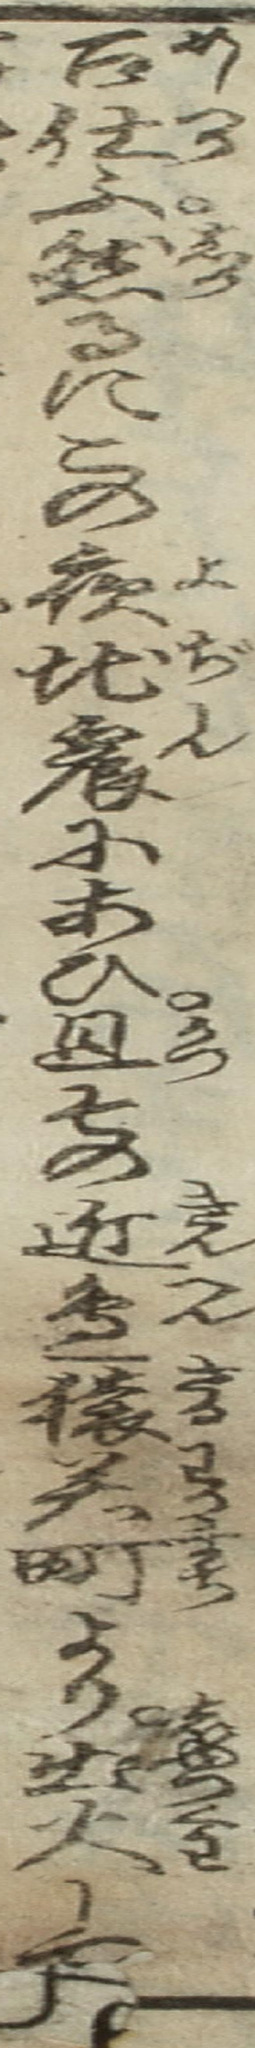召仕ふ。然るにこの夜地震にあひ。且その近辺猿若町より出火して
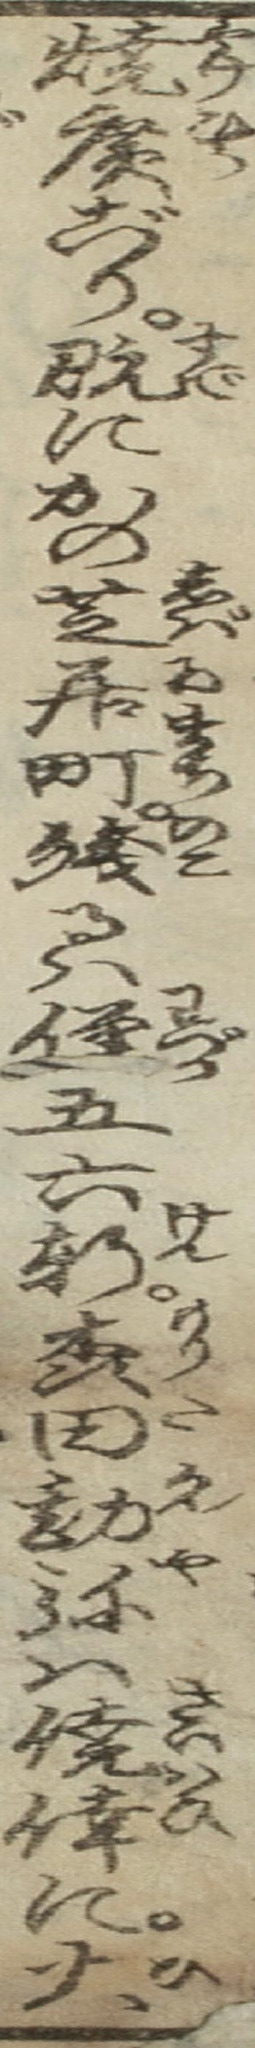焼広ごり。既にかの芝居町。残るは僅五六軒。森田勘弥は僥倖に。火
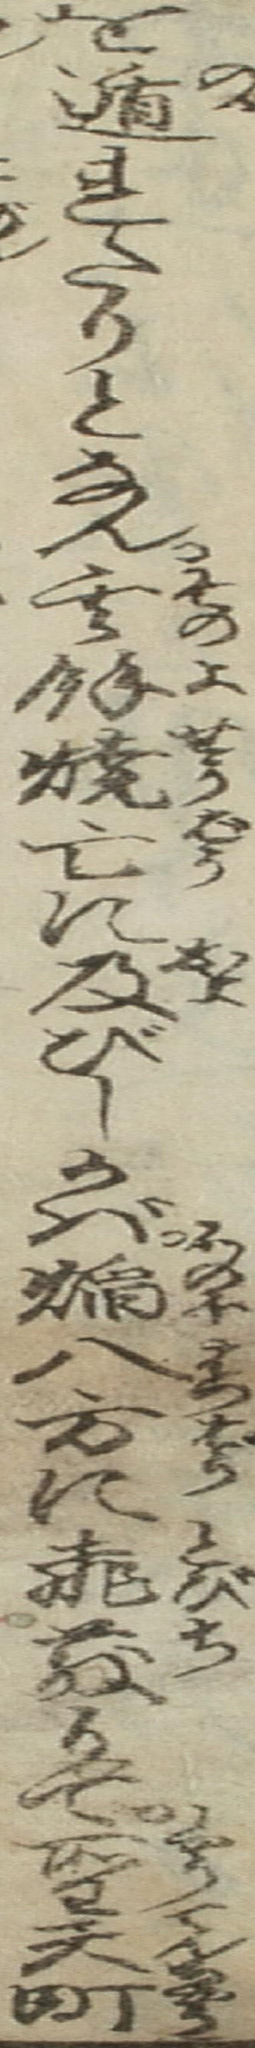を遁れたりとなん。其餘焼亡に及びしかば。焔八方に飛散りて聖天町
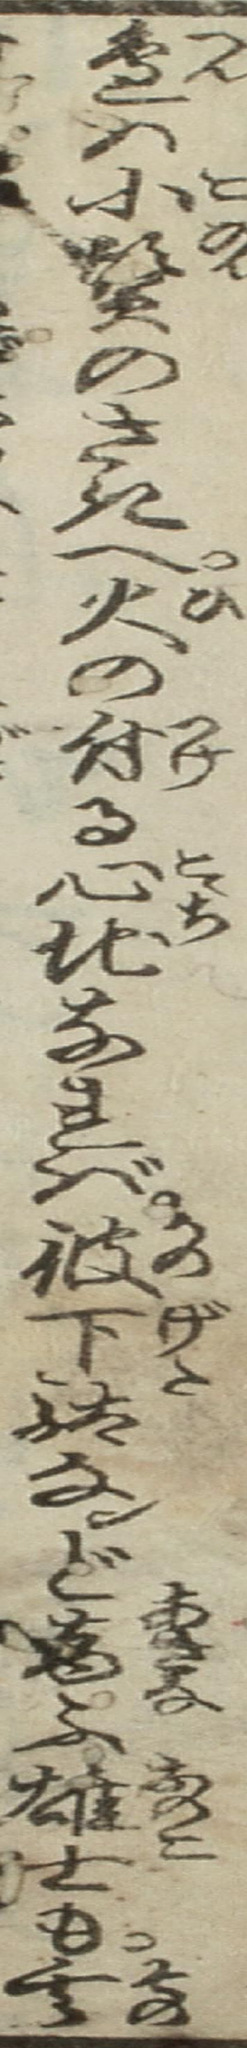辺は小鬢のさきへ火の付る心地なれば。彼下駄など商ふ雄士も。其
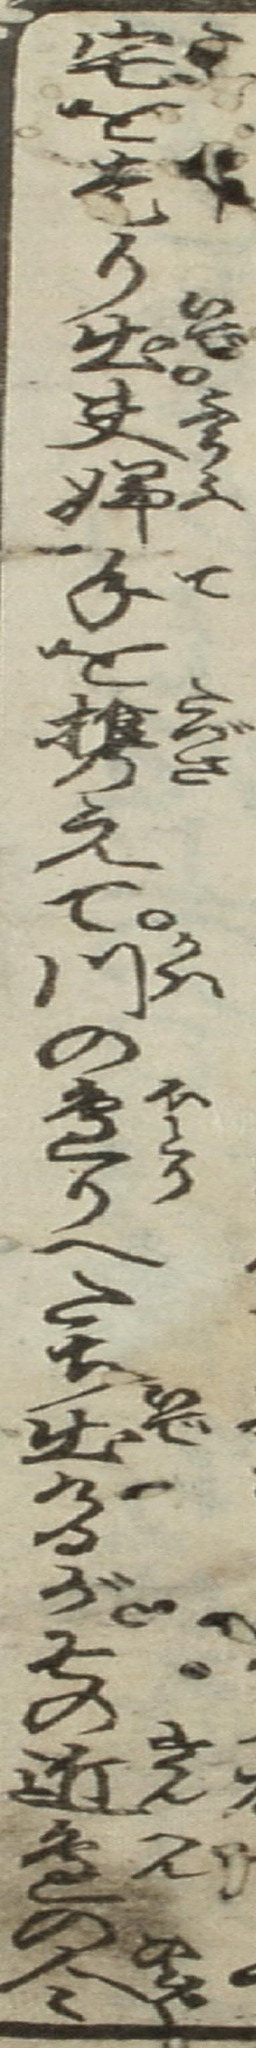宅を走り出。夫婦手を携えて。川の辺りへたち出けるが。その近辺の人々
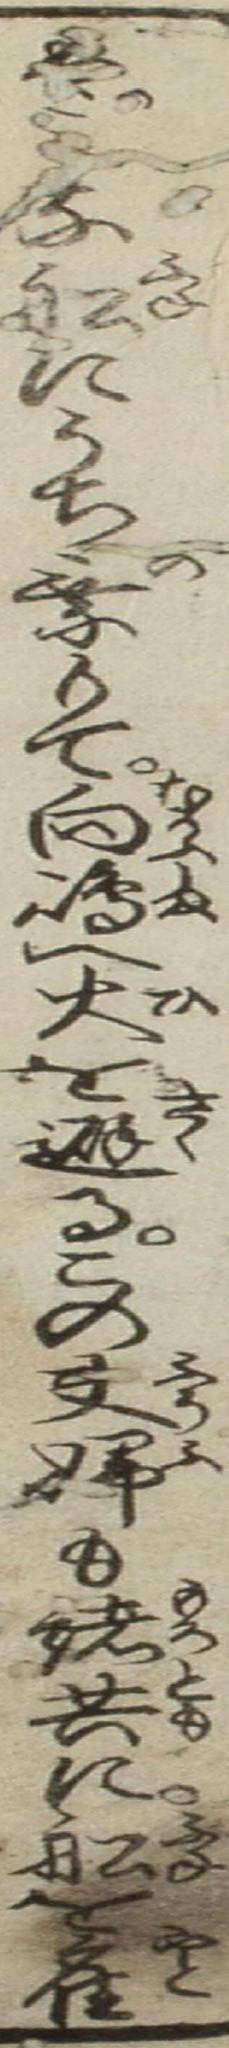はみな船にうち乗りてく向嶋へ火を避る。夫婦も諸共に。船を雇
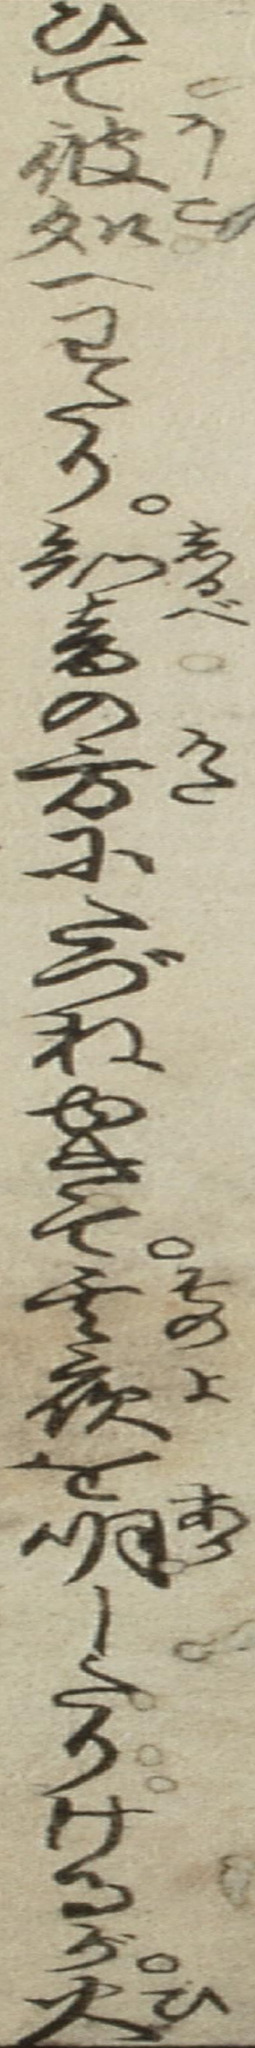ひて彼処へわたり。知者の方にたずねゆきて。其夜を明したりけるが。火
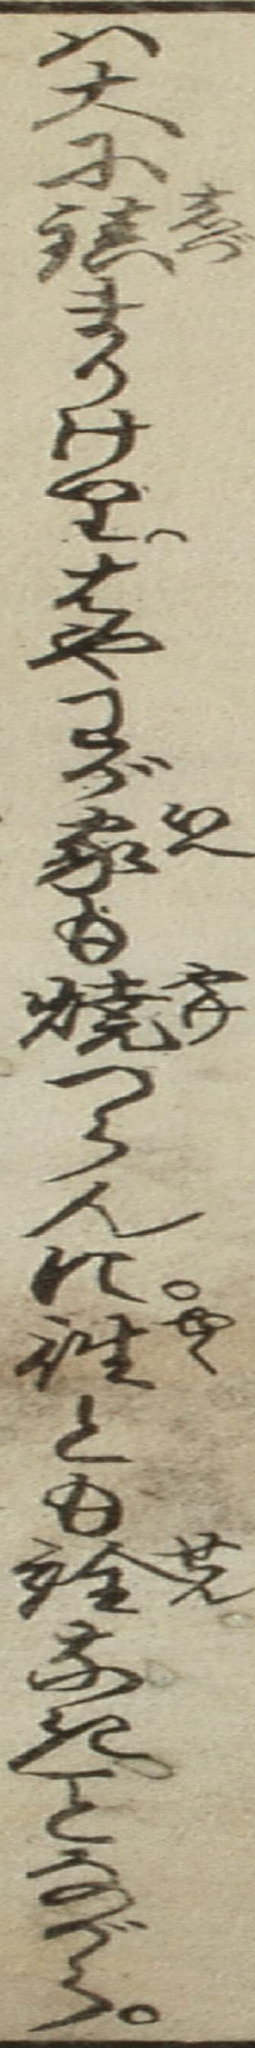は大に鎮まりけり。はやわが家も焼つらんに。往とも詮なきことながら。
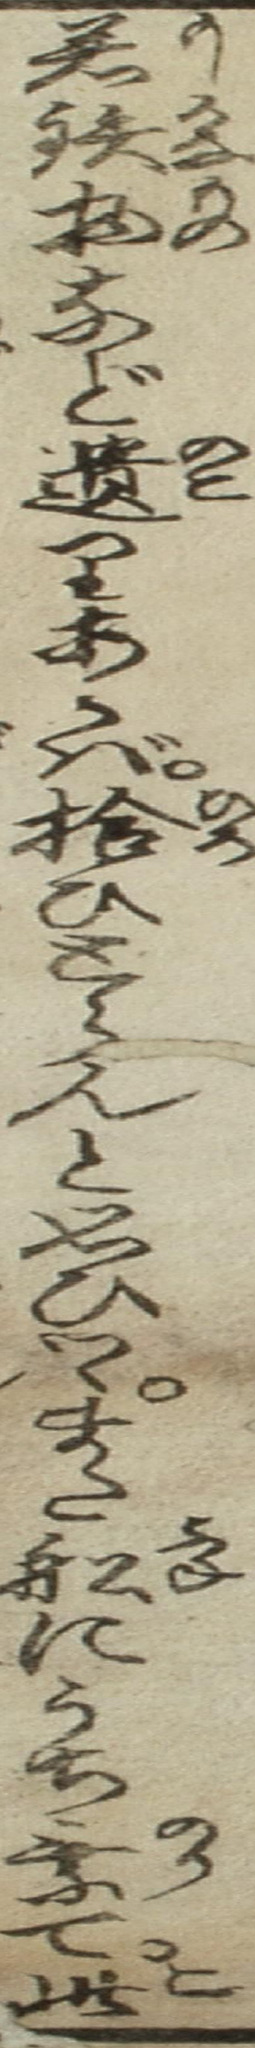若鉄物など遺りあらば拾ひとらんと思ひつゝ。また船にうち乗て此
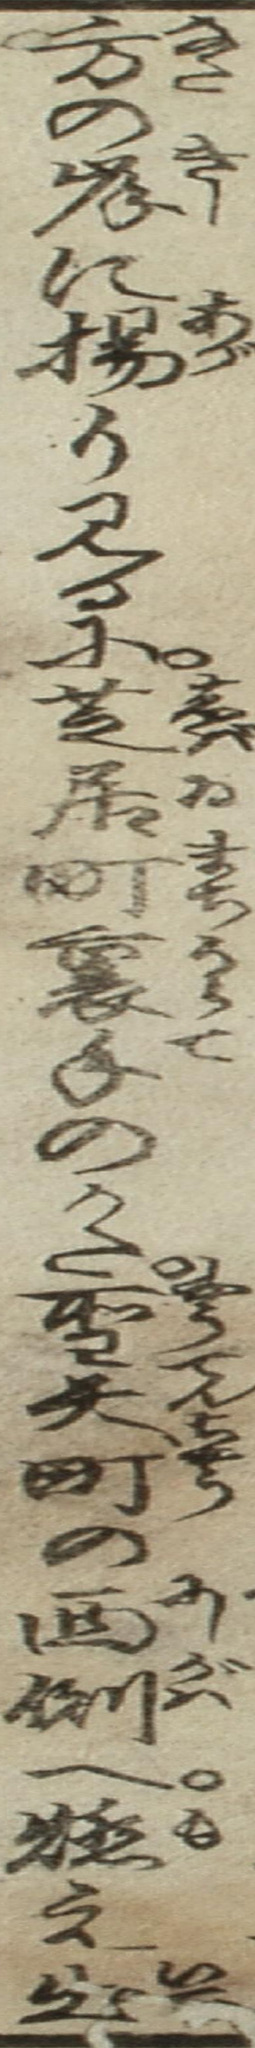方の岸に揚り見るに芝居町裏手のかた聖天町の西側へ燃え出
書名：安政見聞録　中
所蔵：東京大学地震研究所図書室 Earthquake Research Institute Library, The University of Tokyo, JAPAN
